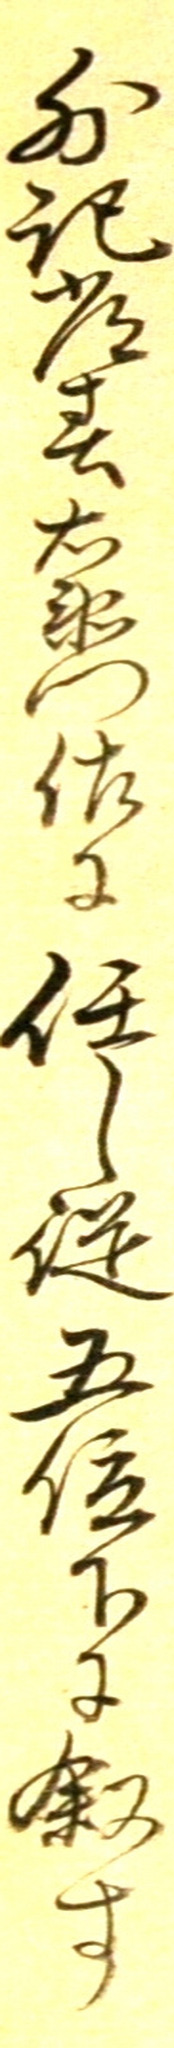外記常春右衛門佐に任し従五位下に叙す

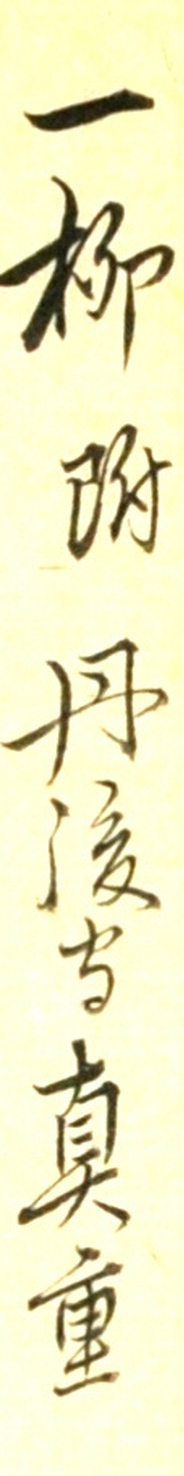一柳付丹後守真重
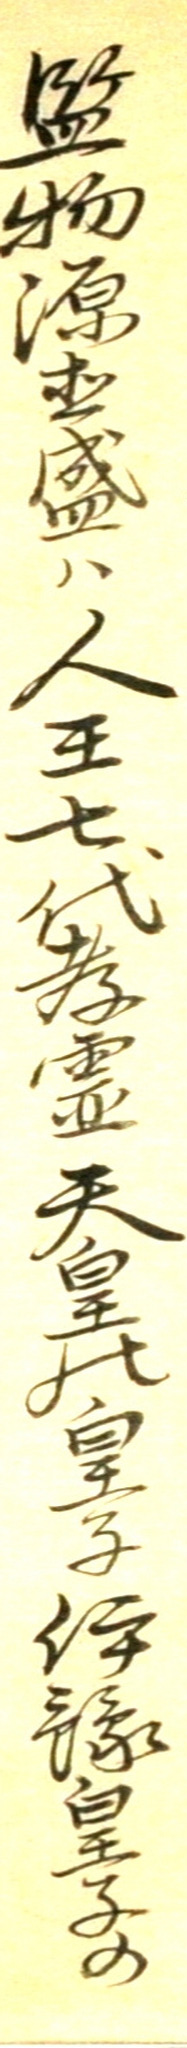監物源直盛は人王七代孝霊天皇の皇子伊予皇子の
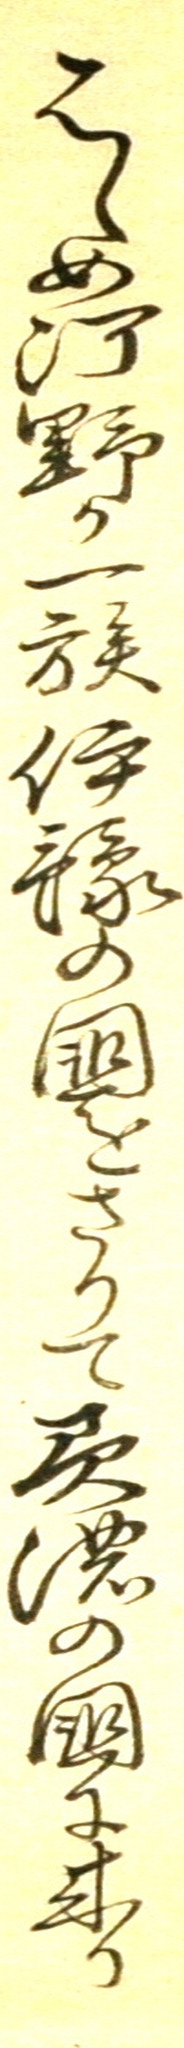はしめ河野か一族伊予の国をさりて美濃の国に来り
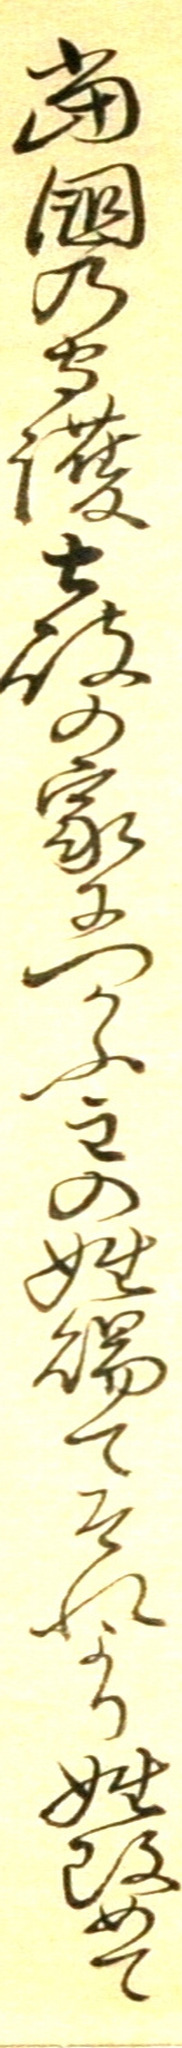当国の守護土岐の家につかふ主の姓賜てそれより姓改めて

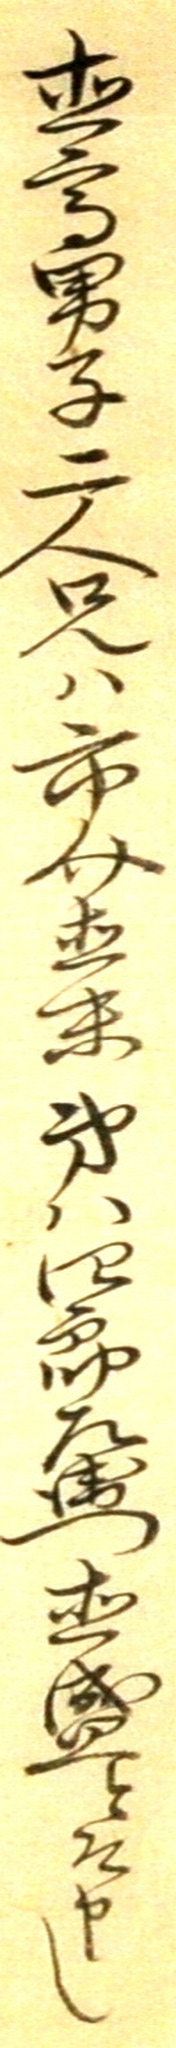直高男子二人兄は市介直末弟は四郎左衛門直盛とそ申し
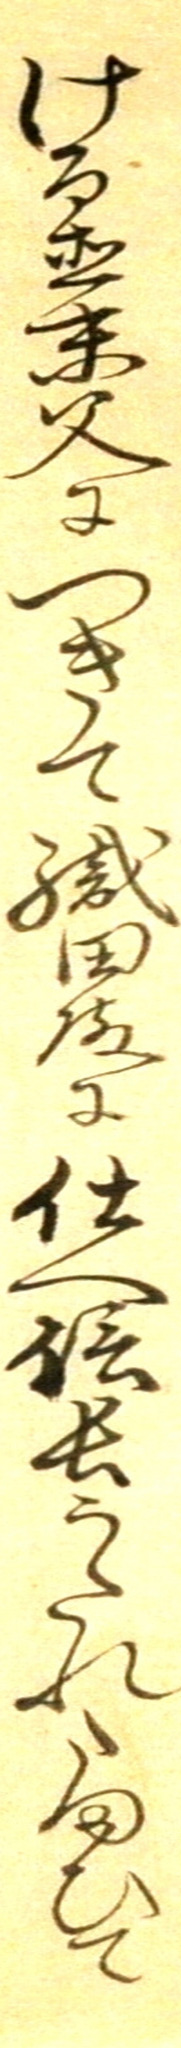ける直末父につきて織田殿に仕へ信長うたれたまひて
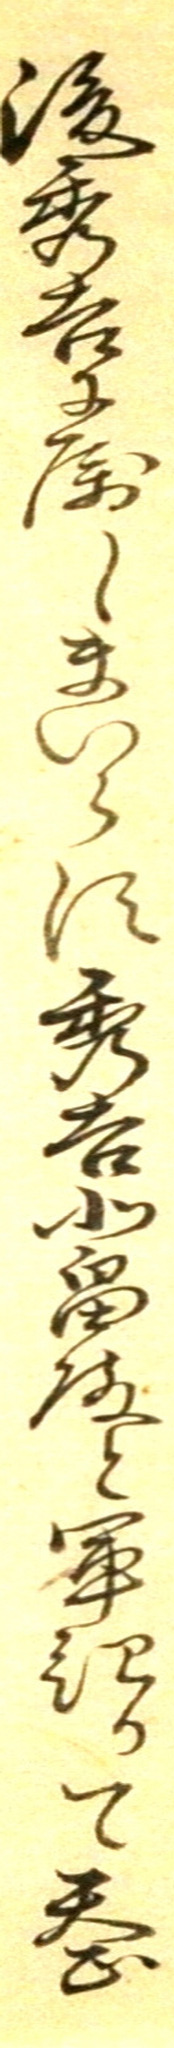後秀吉に属しまいらす秀吉北畠殿と軍起りて天正
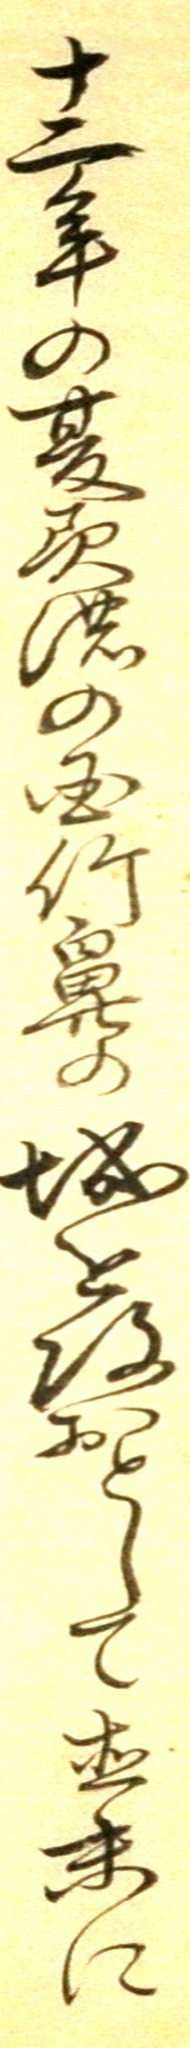十二年の夏美濃の国竹鼻の城を攻おとして直末に
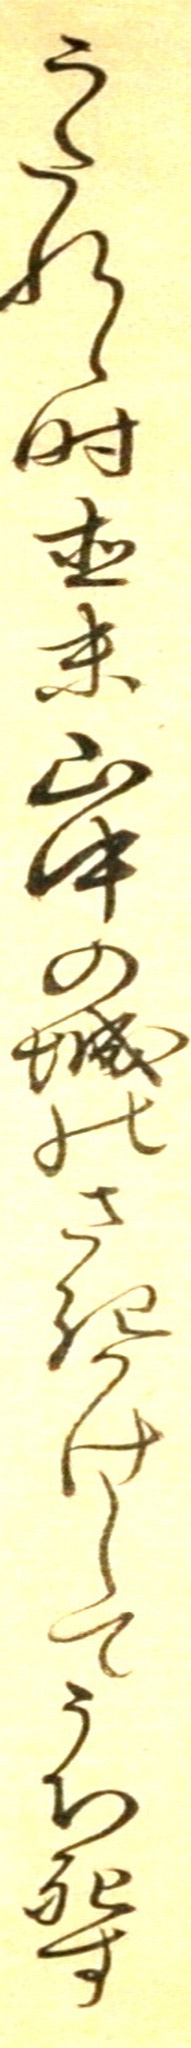うたれし時直末山中の城のさきかけしてうち死す
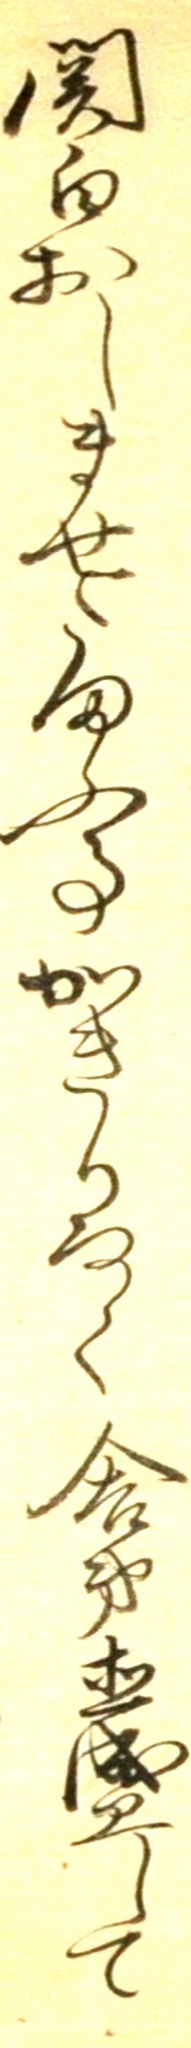関白おしませたまふ事かきりなく舎弟直盛して
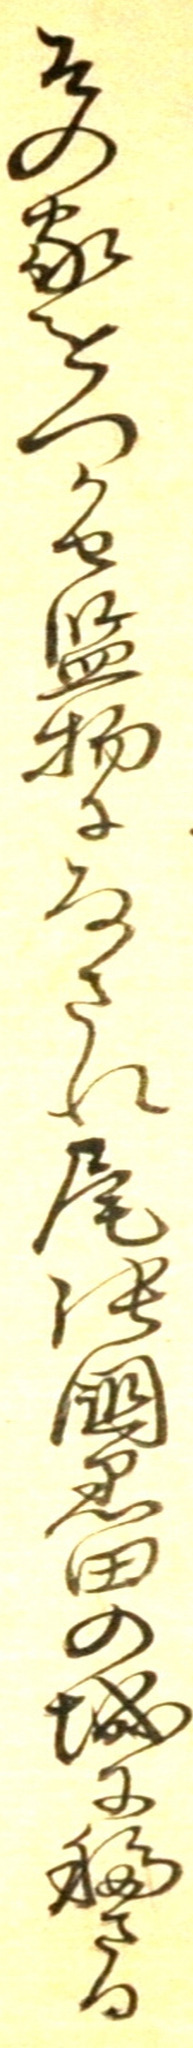その家をつかせ監物になされ尾張国黒田の城に移さる
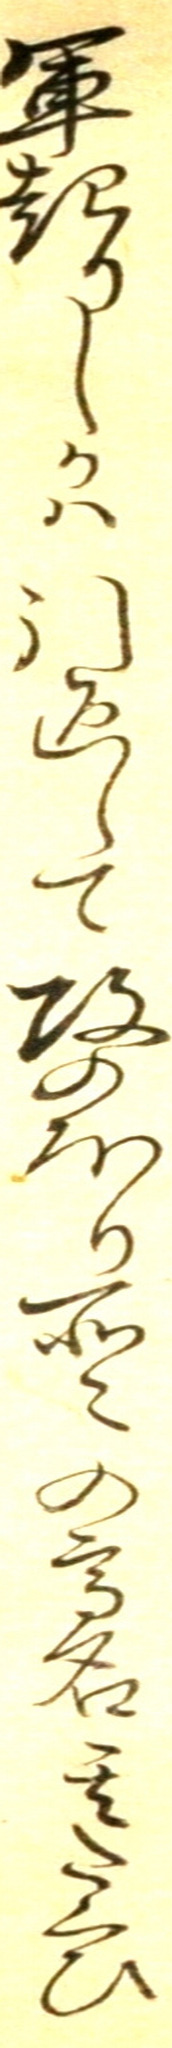軍起りしかは引返して攻のほり所々の高名其たくひ
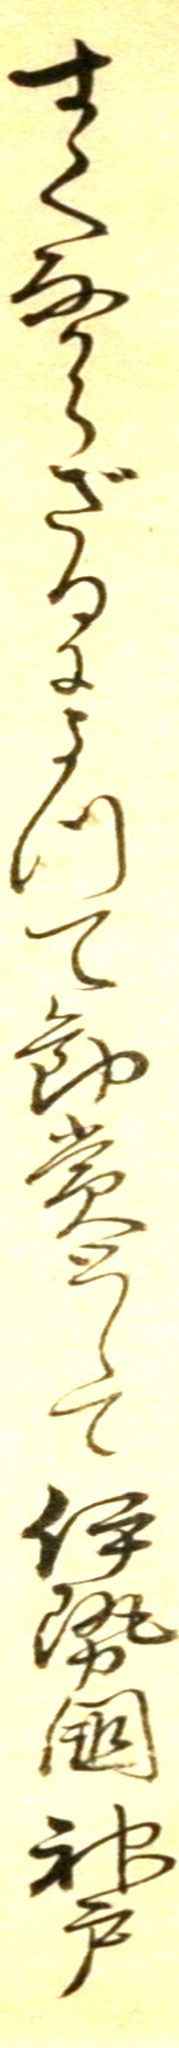すくなからざるによつて勧賞として伊勢国神戸
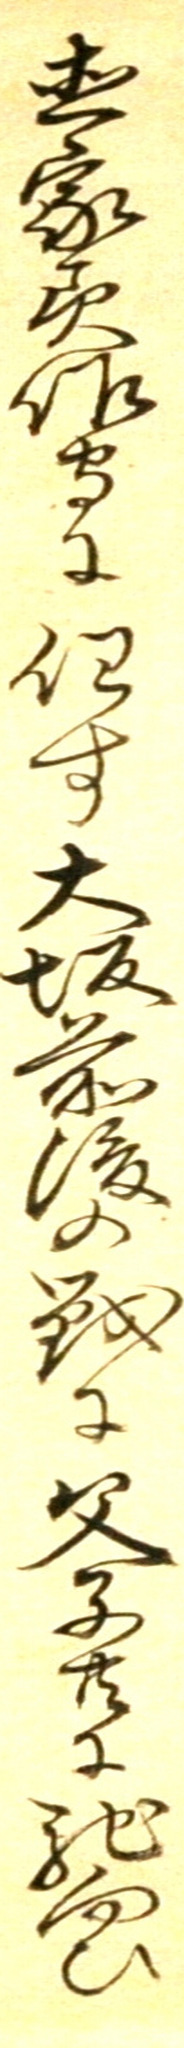直家美作守に任す大坂前後の戦に父子共に馳向ひ
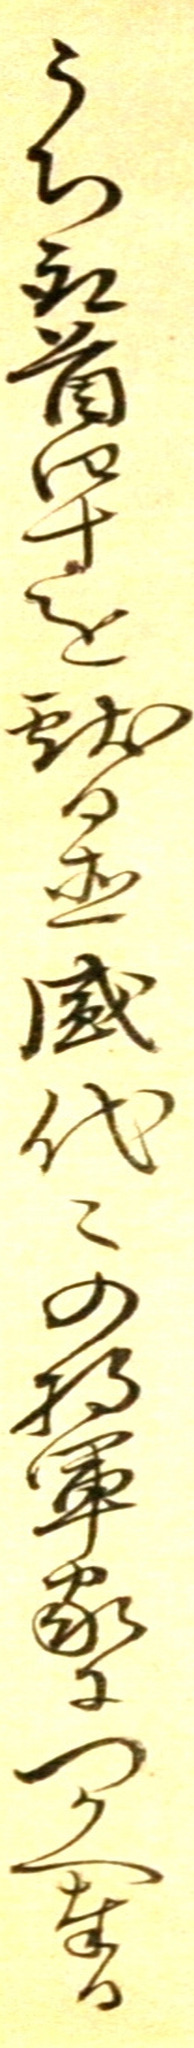うち取首四十を献る直盛代々の将軍家につかへ奉る
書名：藩翰譜（九・上）
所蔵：伊那市立高遠町図書館・合同会社AMANE
